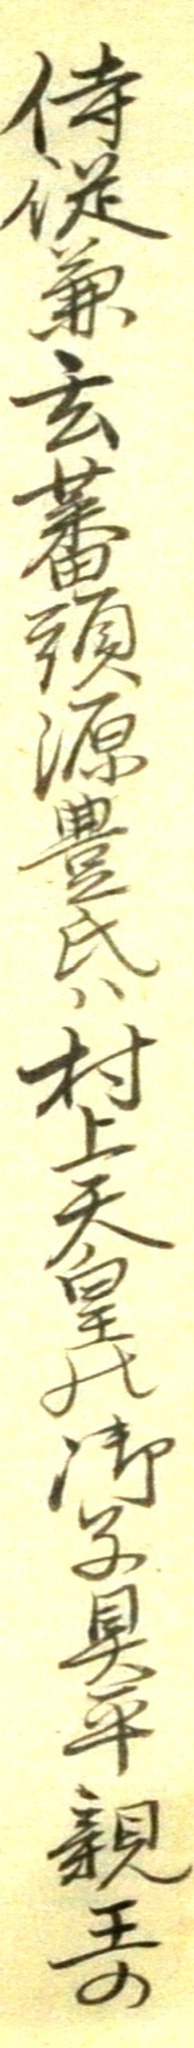侍従兼玄蕃頭源豊氏は村上天皇の御子具平親王の
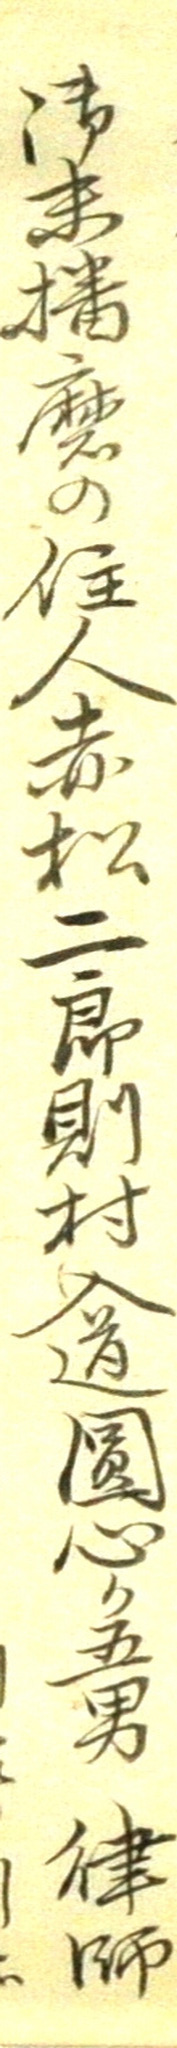御末播磨の住人赤松二郎則村入道円心か五男律師
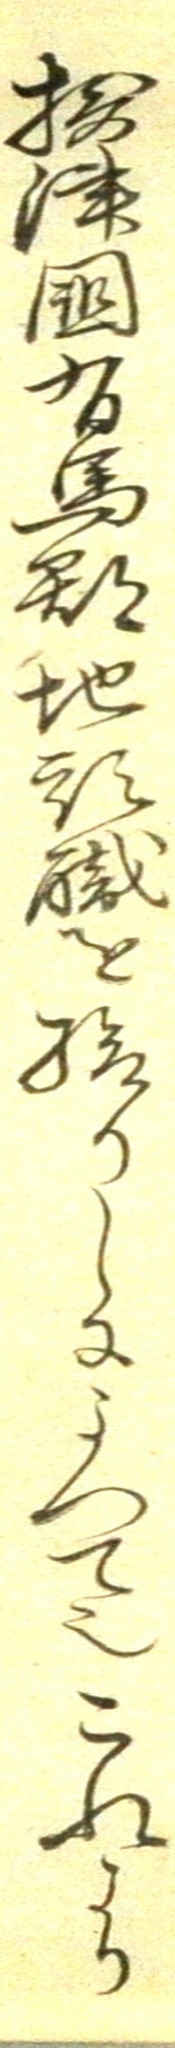摂津国有馬郡地頭職を給りしによつて也これより
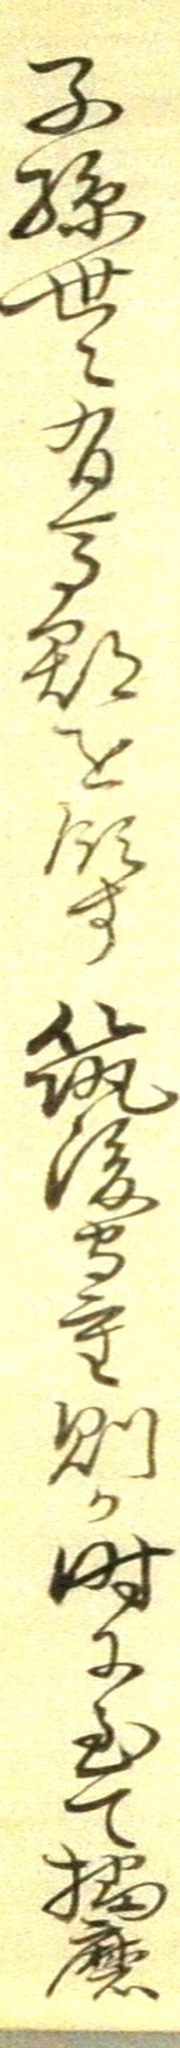子孫世々に有馬郡を領す筑後守重則か時に至て播磨
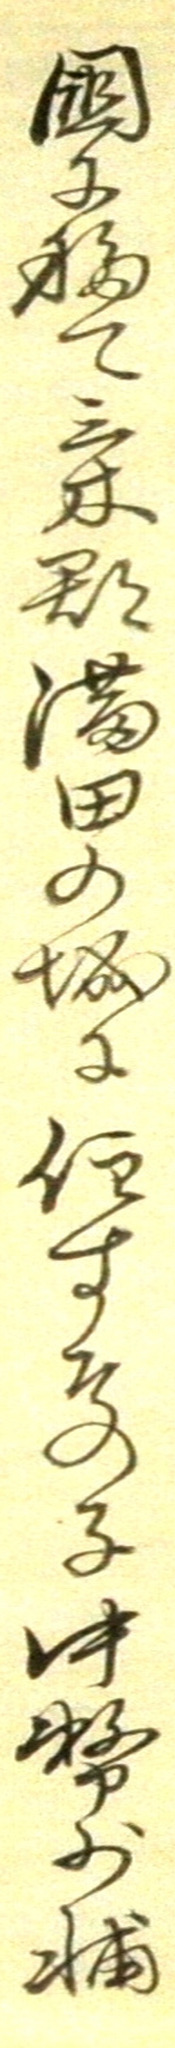国に移て三木郡満田の城に住すその子中務少輔
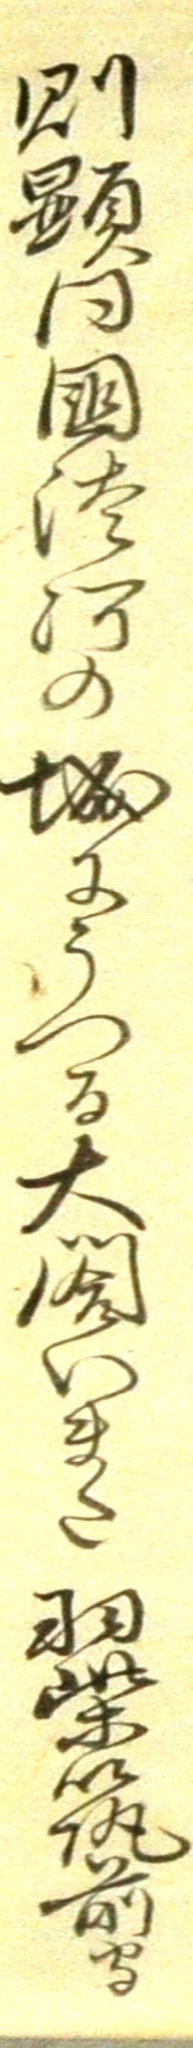則顕同国淡河の城にうつる太閤いまた羽柴筑前守
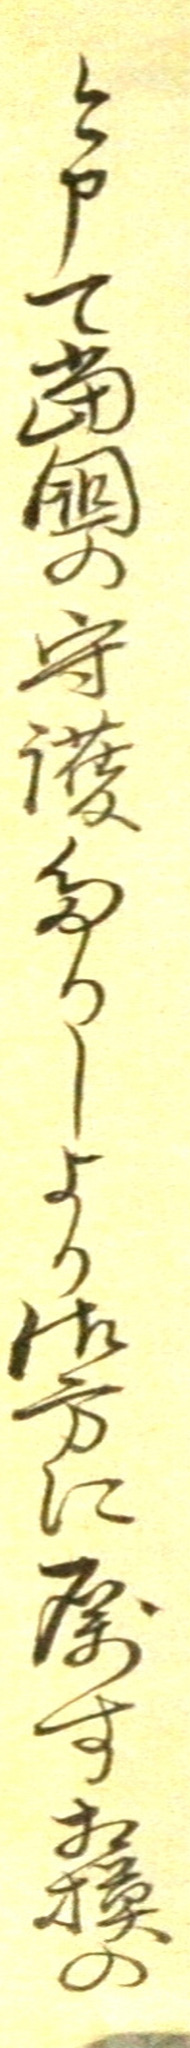と申て当国の守護たりしより御方に属す相模の

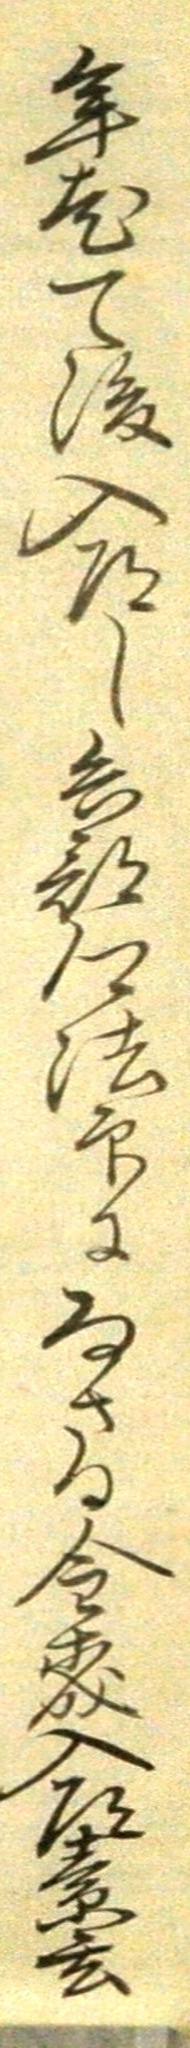年老て後入道し兵部卿法印になさる金森入道素玄
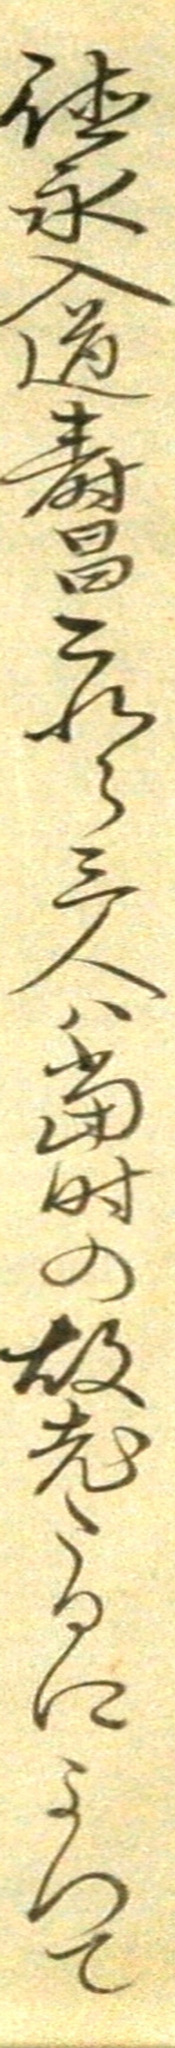徳永入道寿昌これら三人は当時の故老たるによつて
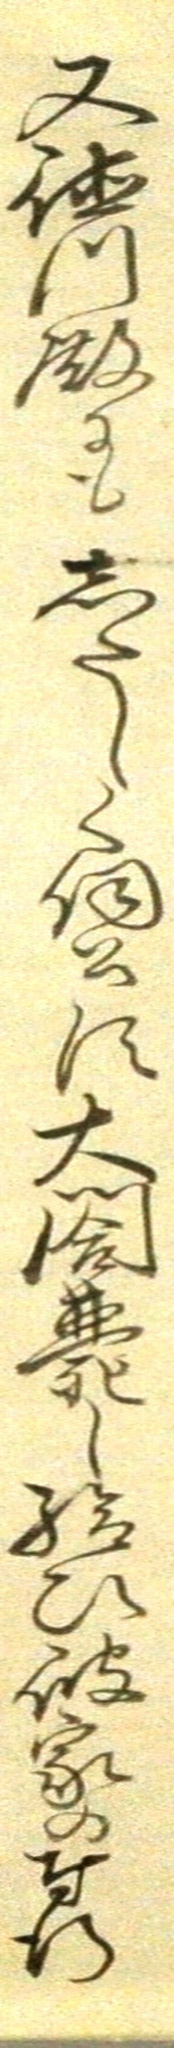又徳川殿にもしたしく伺公す太閤薨し給ひ彼家の奉行
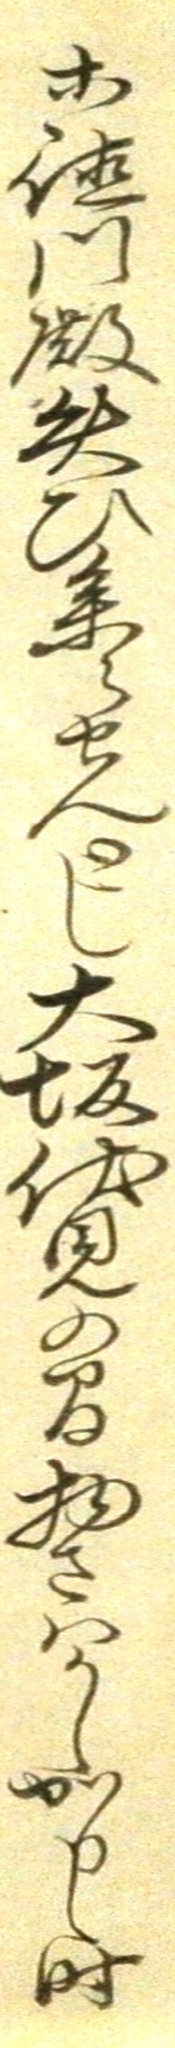等徳川殿失ひ参らせんとし大坂伏見の間物さはかしかりし時
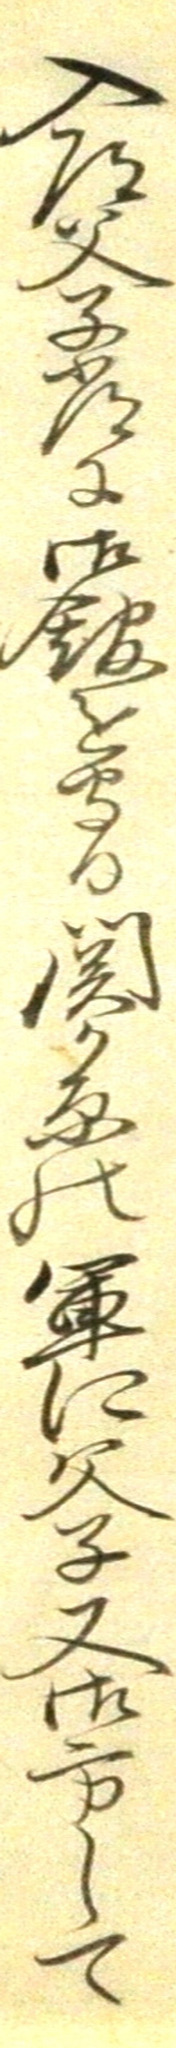入道父子常に御館を守る関ゕ原の軍に父子又御方して
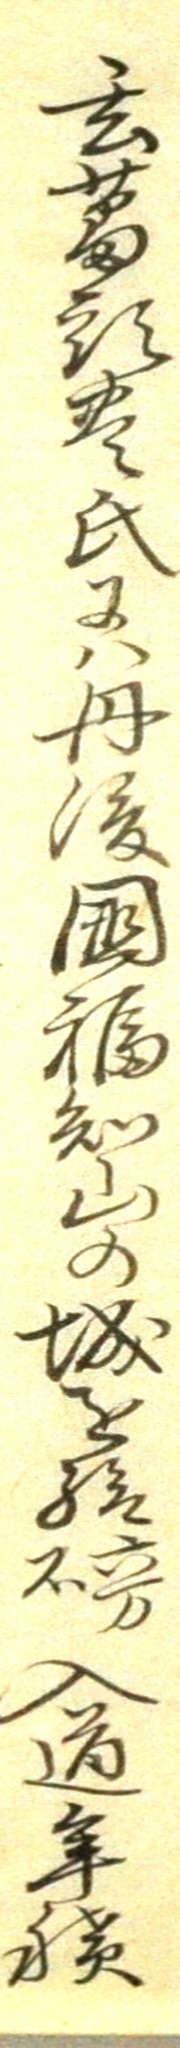玄蕃頭豊氏には丹後国福知山の城を給六万石入道年積
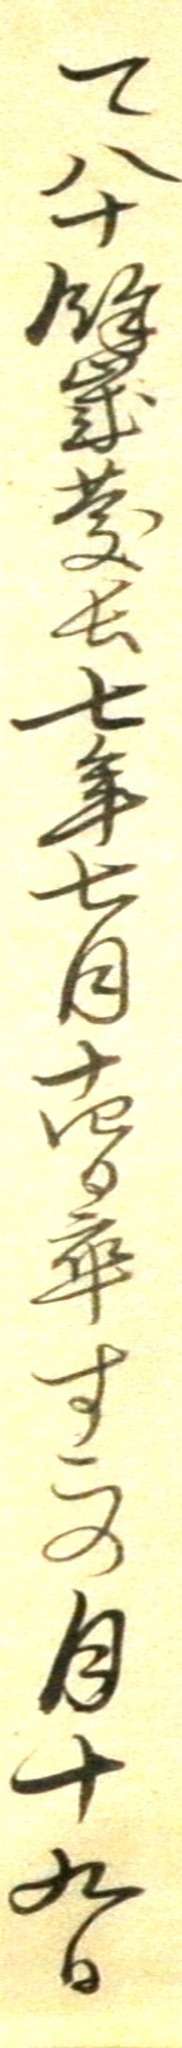て八十余歳慶長七年七月十四日卒すこの月十九日
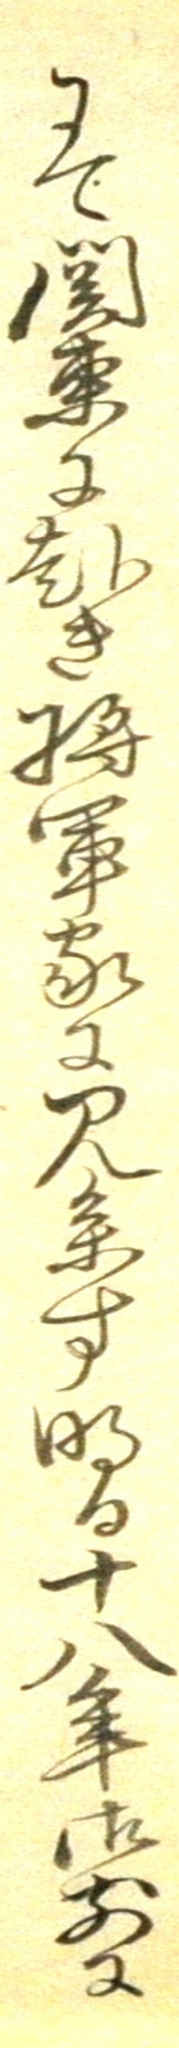にて関東に赴き将軍家に見参す明る十八年御前に
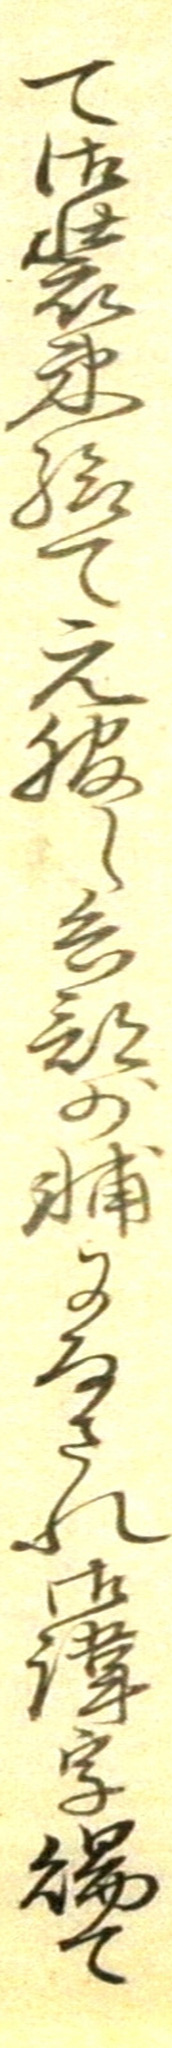て御装束給て元服し兵部の輔になされ御諱字賜て
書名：藩翰譜（七・上）
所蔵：伊那市立高遠町図書館・合同会社AMANE
